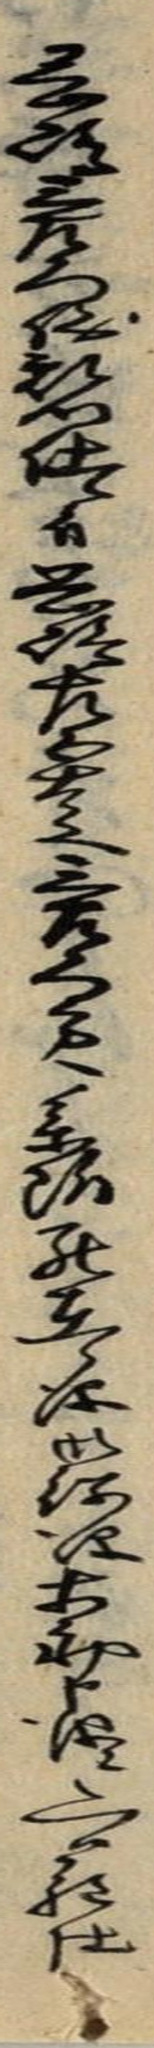岡島三左衛門儀乱心仕候付岡島左五大夫三左衛門方へ参附罷在候儀御役儀相勤申儀に候へは難仕
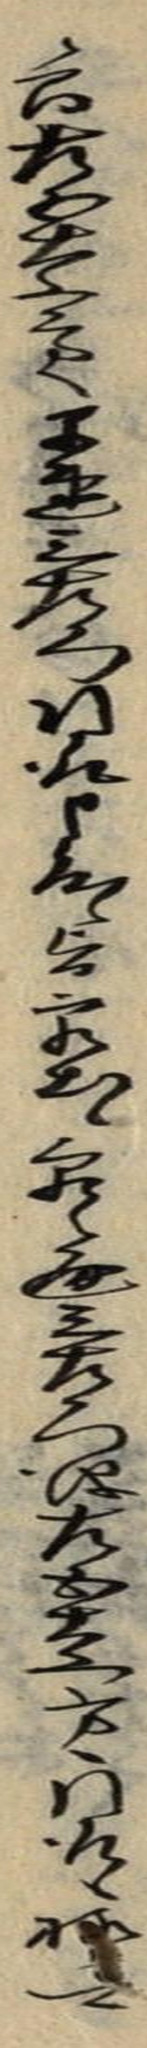候間左五大夫方へ早速三左衛門引取申度候旨最出候願之通三左衛門儀左五大夫方へ引取候様可
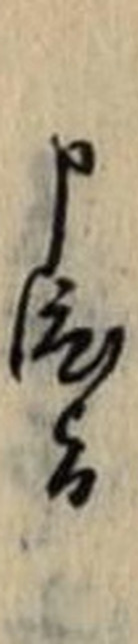申渡旨
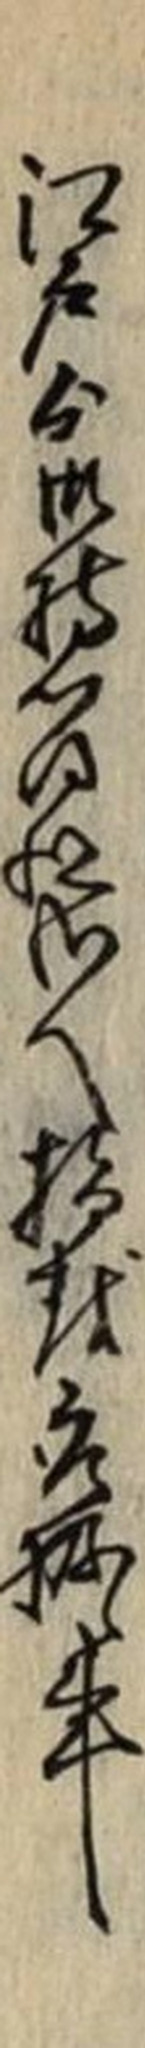江戸ゟ御持筒組弐人指越取扱候事
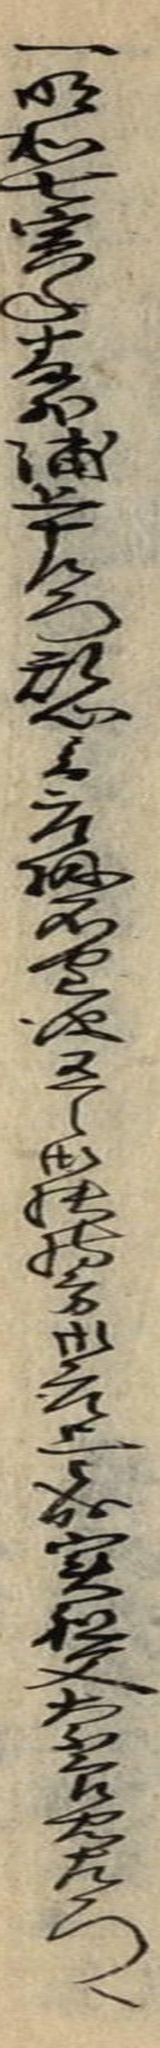一明和七寅年番外浦上十左衛門乱心にて取扱不宜儀有之御扶持方御取上被成実祖父奈良忠左衛門へ
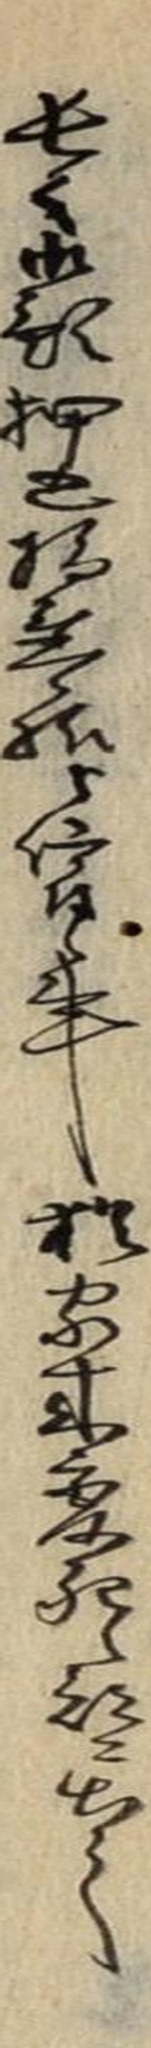長く御預押込指置候様被仰付候事猶家来変死之部に出之
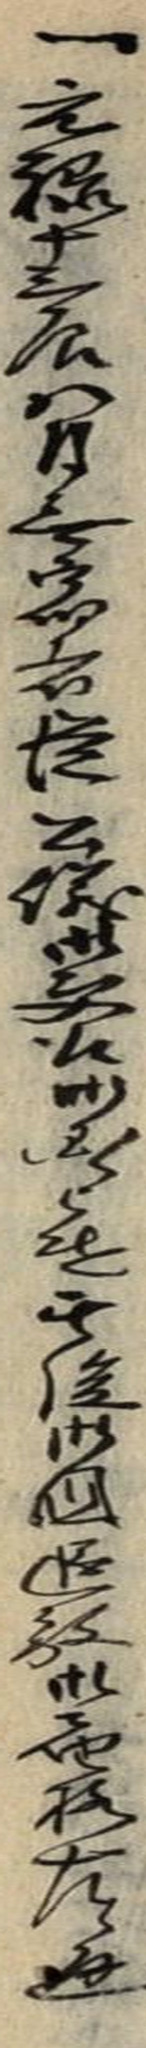一元禄十三辰八月無宿者従公儀御受取御国へ被遣其後御国追放御届様左之通
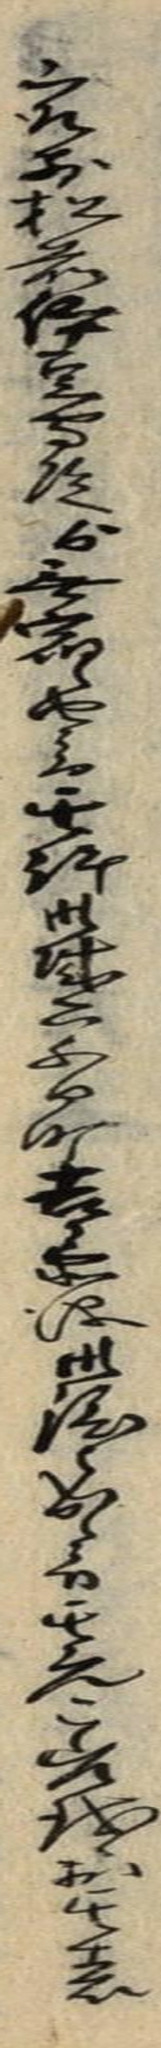最前松前伊豆守殿ゟ無宿之由にて其許御城下千日町吉兵衛儀御渡被成候に付其元へ差越候於其表
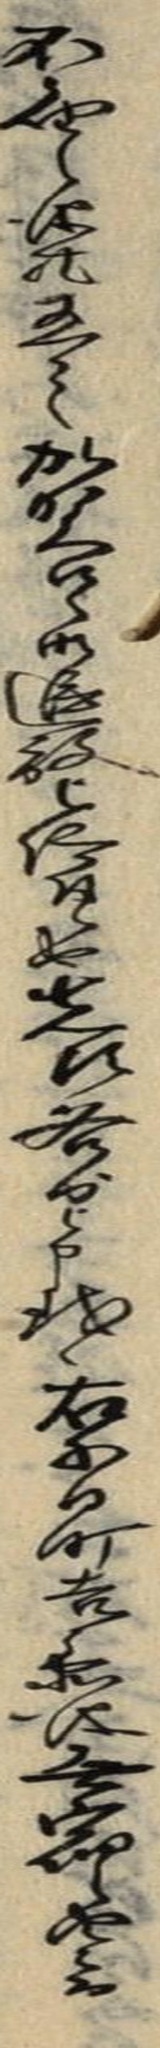不届之儀共有之加賀口へ御追放被仰付候由先比各ゟ被申越候右千日町吉兵衛儀無宿之由にて
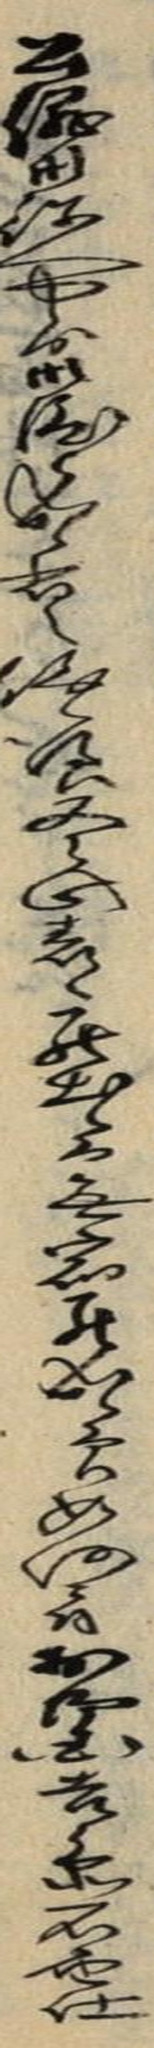公儀御役人中ゟ御渡被成候者之儀候得は又々此表へ罷出候て無宿罷成候ては如何に付於御国吉兵衛不届仕
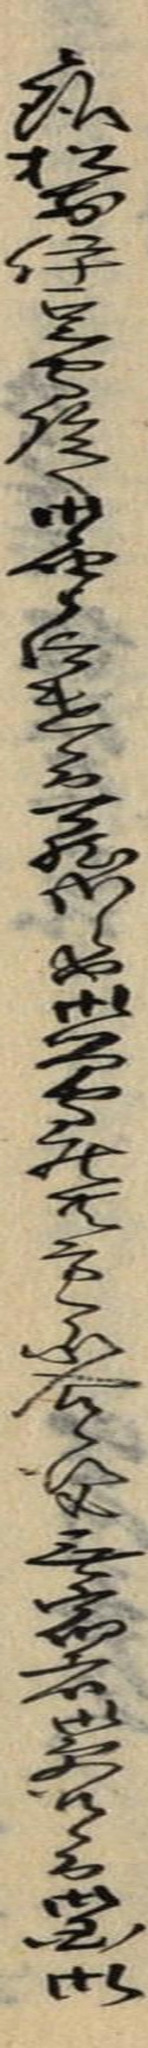候趣松前伊豆守殿へ御届被仰遣候て可然哉之由御留守居共方へ承合候得共無宿者御受取候て御国御
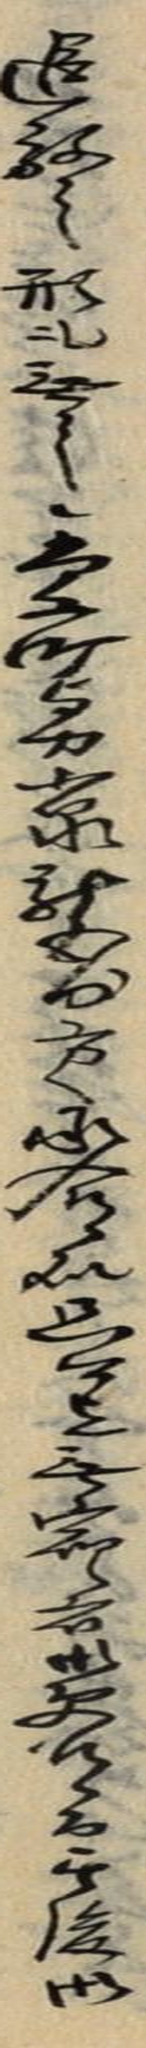追放之形も無之候尚又町与力小泉新五右衛門方へ承合候処只今迄無宿之者御受取候て其後御
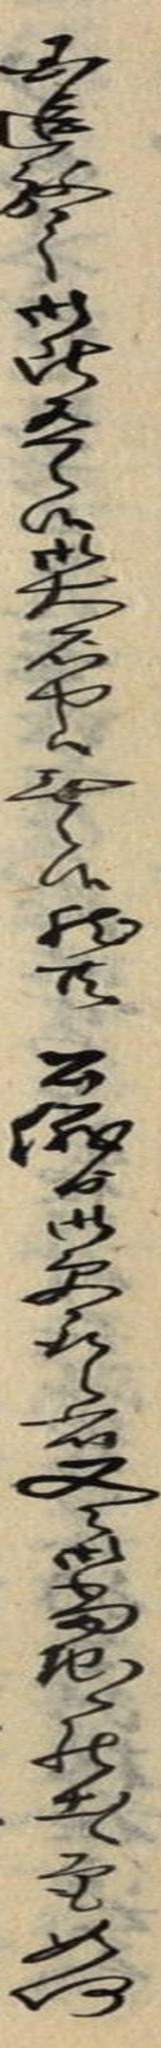国追放之御断有之候御大名中は無之候然共公儀ゟ御受取之者又々御当地へ罷出候ても如何
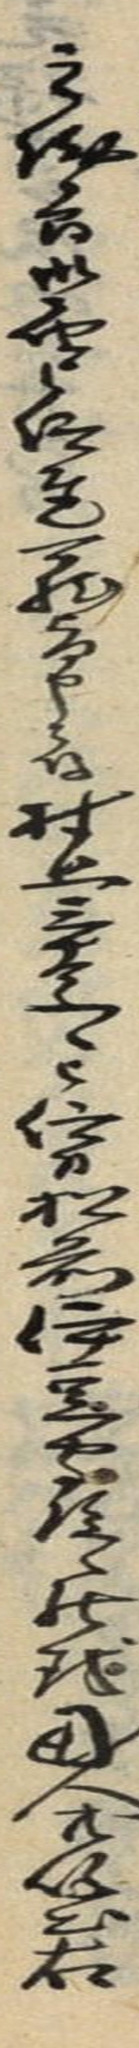之儀候間御届被仰達可然旨申に付村上三大夫へ被仰付松前伊豆守殿へ罷越用人共呼出右
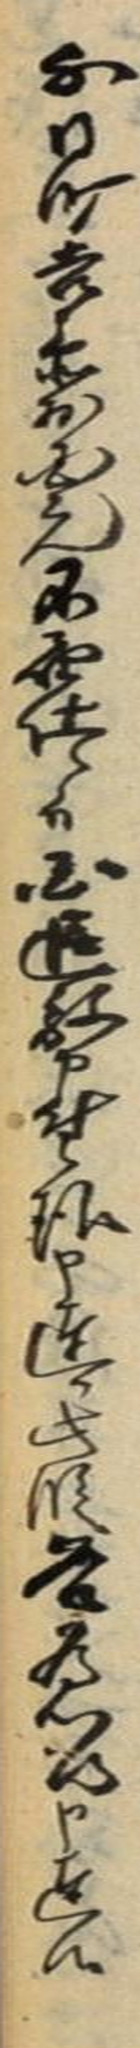千日町吉兵衛於国元不届仕候に付国追放申付候趣申達候此段各為心得申達候
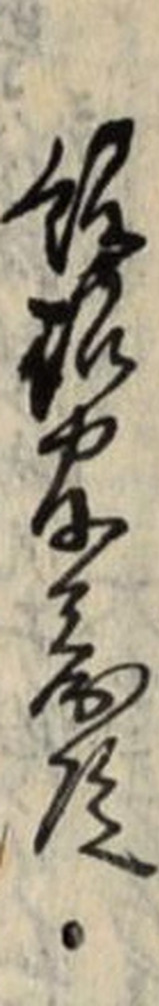飯沼官兵衛殿
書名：御停止異変死失
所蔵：福井県文書館 Fukui Prefectural Archives
